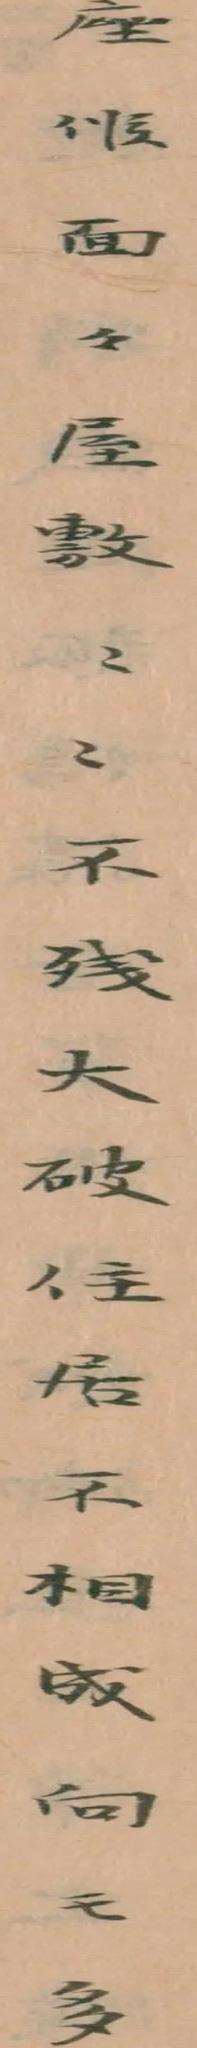座候面々屋敷〃〃不残大破住居不相成向モ多
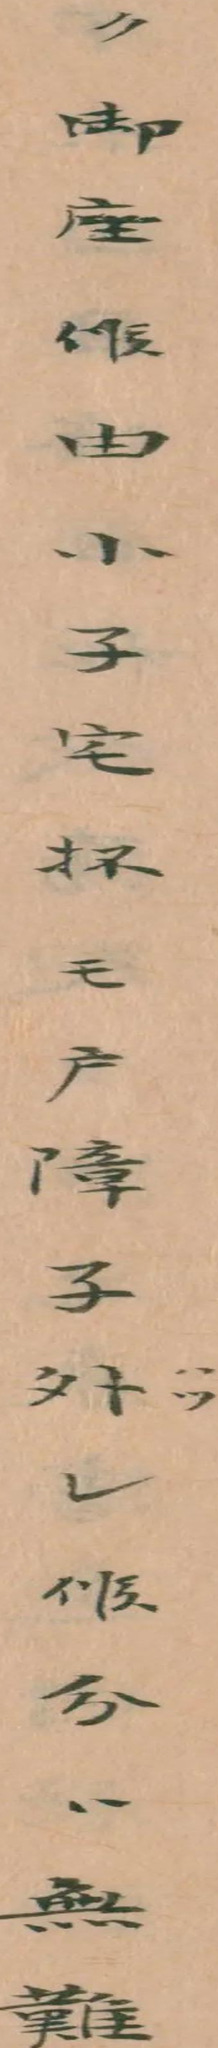ク御座候由小子宅抔モ戸障子外レ候分ハ無難
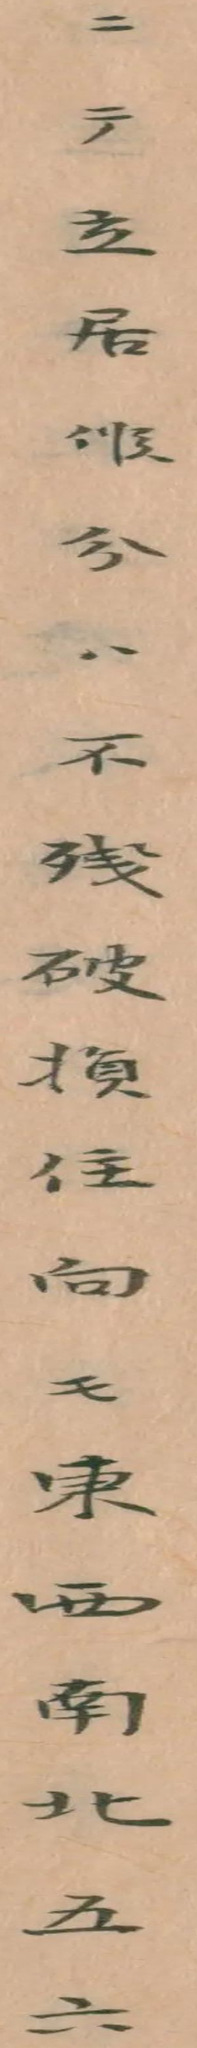ニテ立居候分ハ不残破損住向モ東西南北五六
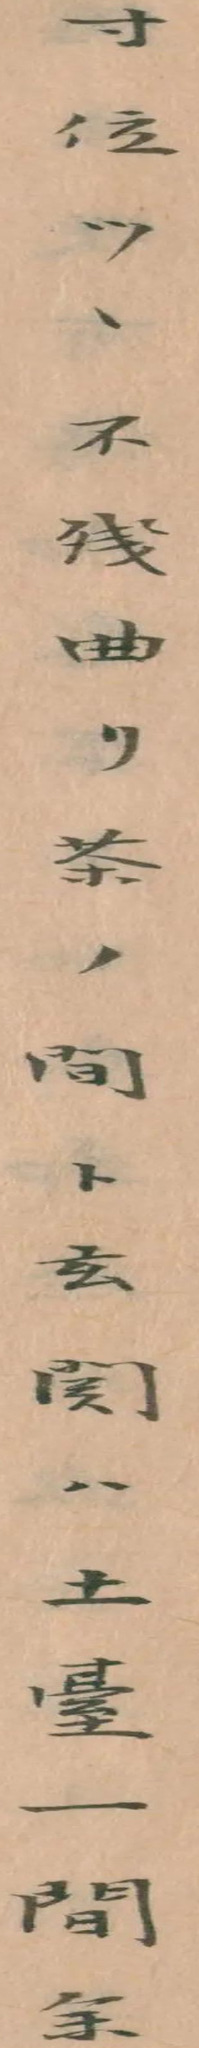寸位ツゝ不残曲り茶ノ間ト玄関ハ土台一間余
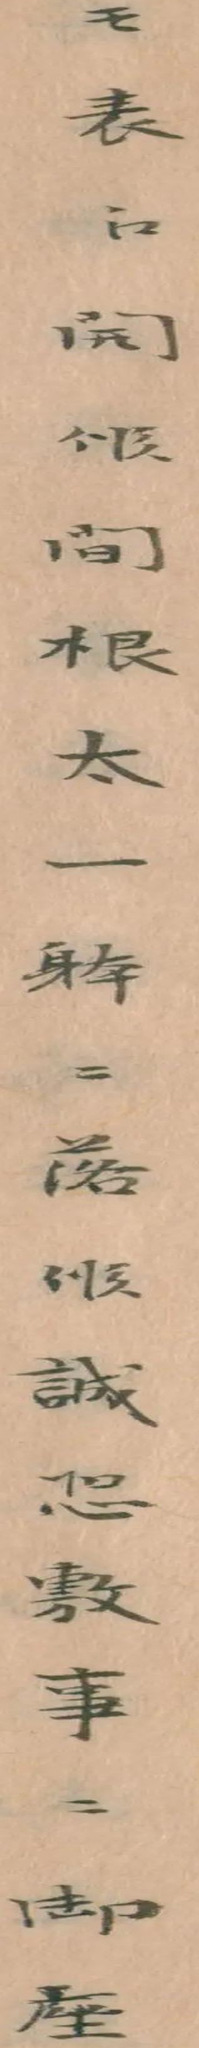モ表江開候間根太一体二落候哉恐敷事二御座
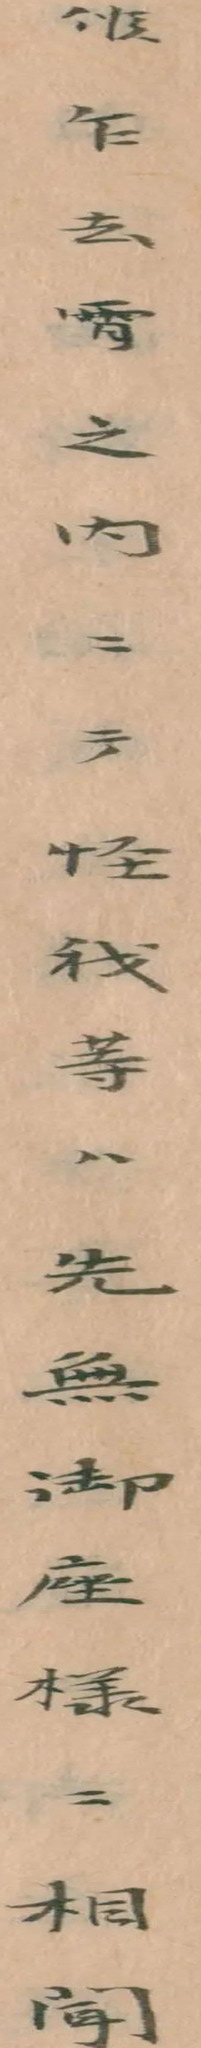候乍去宵之内ニテ怪我等ハ先無御座候二相聞
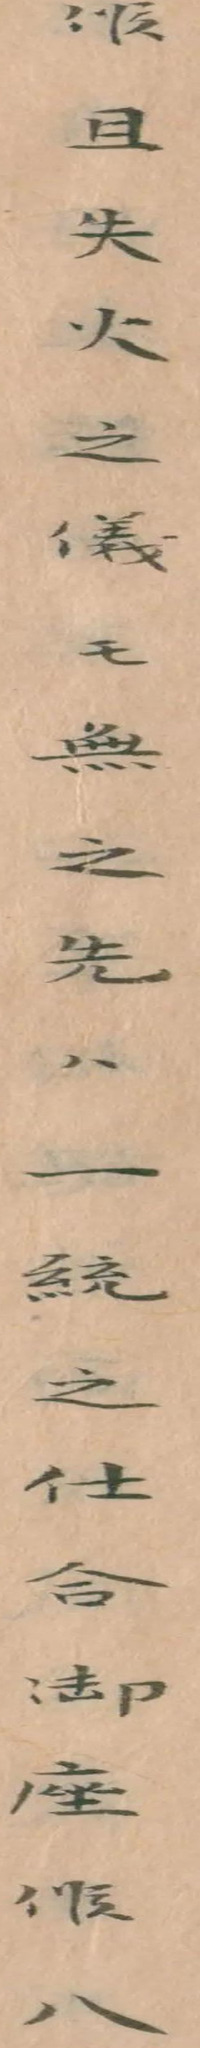候且失火之儀モ無之先ハ一統之仕合御座候八
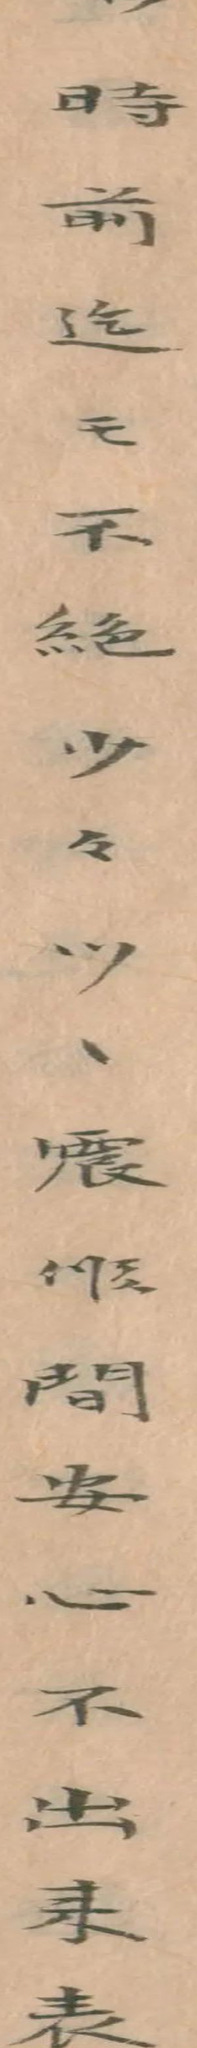ッ時前迄モ不絶少々ツゝ震候間安心不出来表

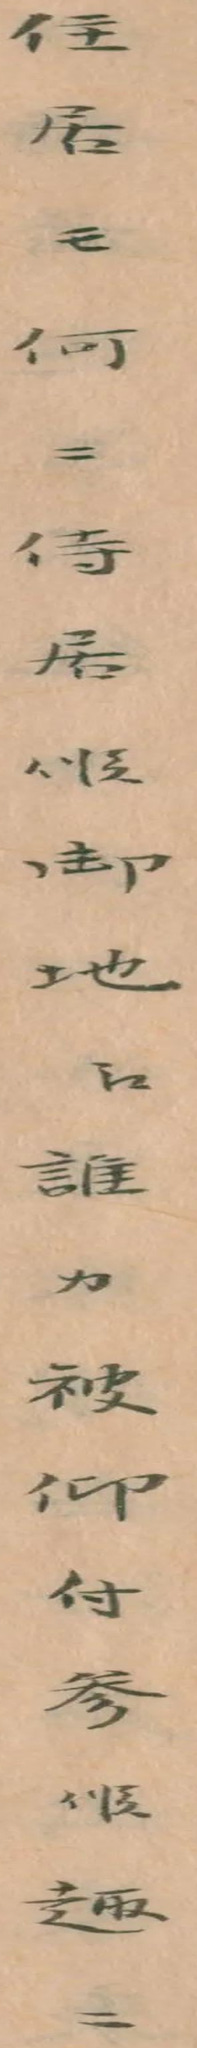住居モ何二侍居候御地江誰カ被仰付参候趣二
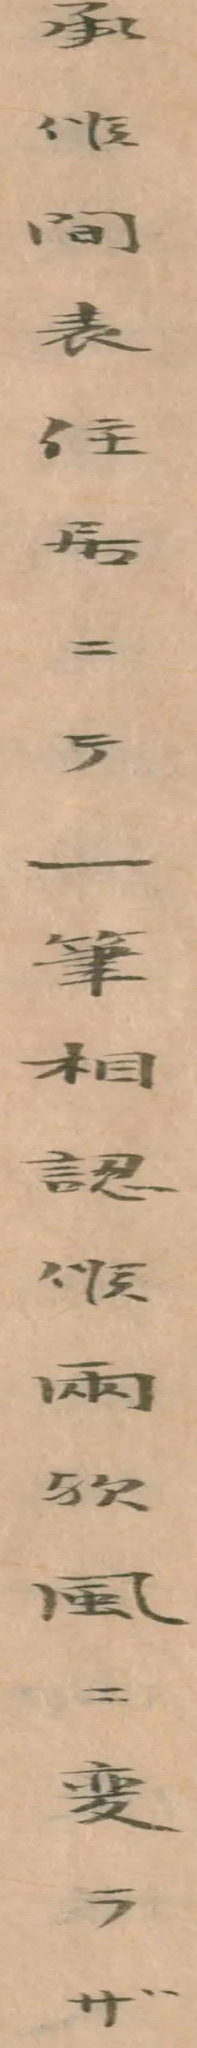承候間表住居ニテ一筆相認候両歟風二変ラザ
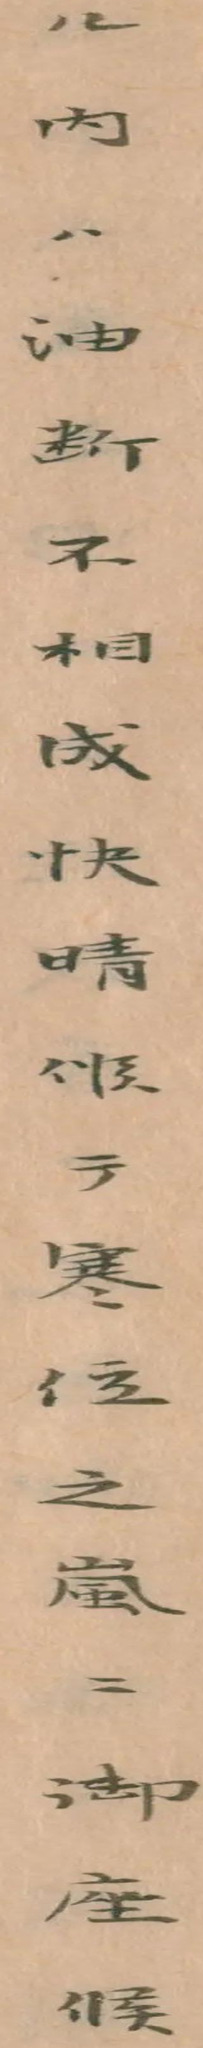ル内ハ油断不相成快晴候テ寒位之嵐二御座候
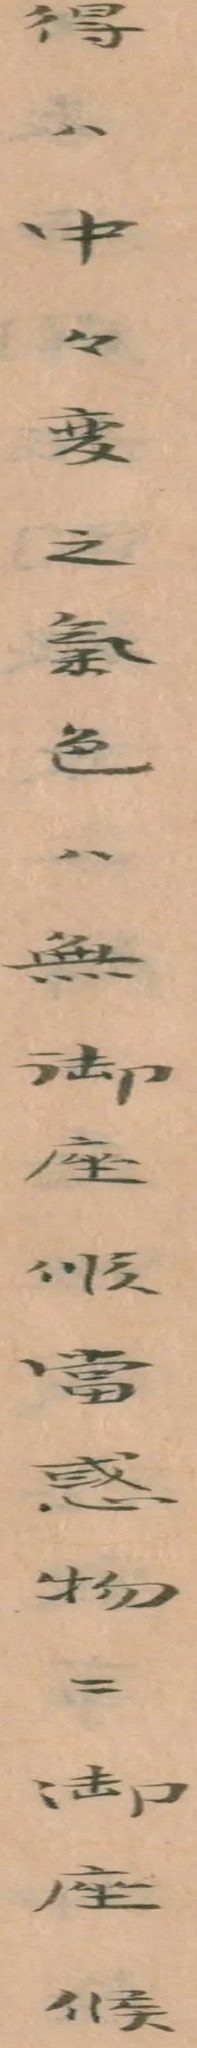得ハ中々変之気色ハ無御座候当惑物二御座候
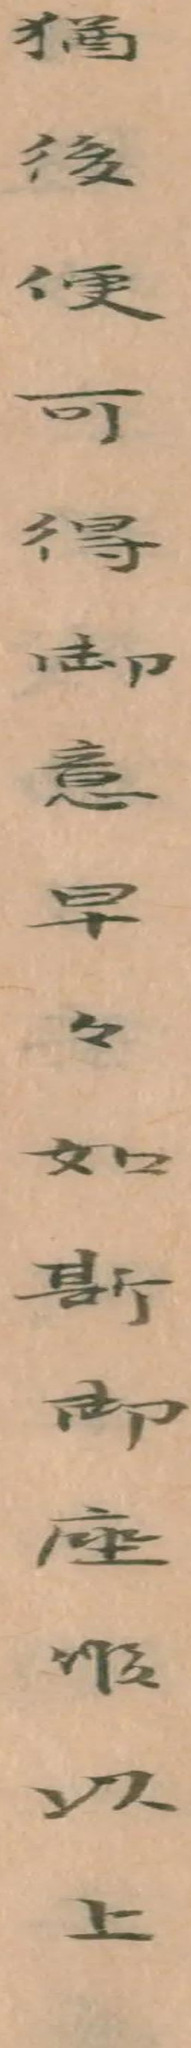猶後便可得御意早々如斯御座候以上
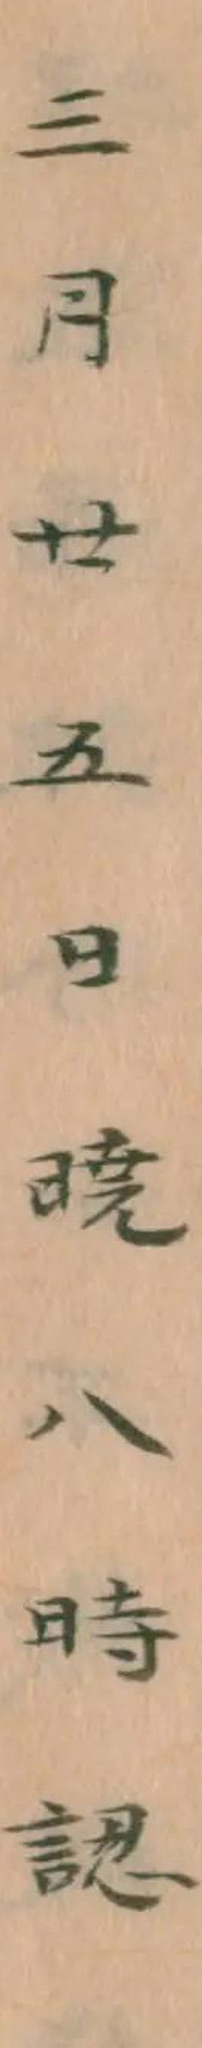三月廿五日暁八時認
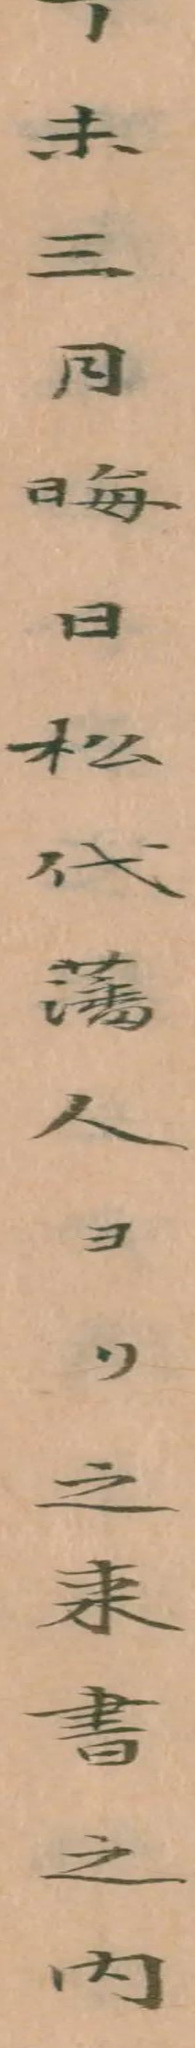丁未三月晦日松代藩人ヨリ之来書之内
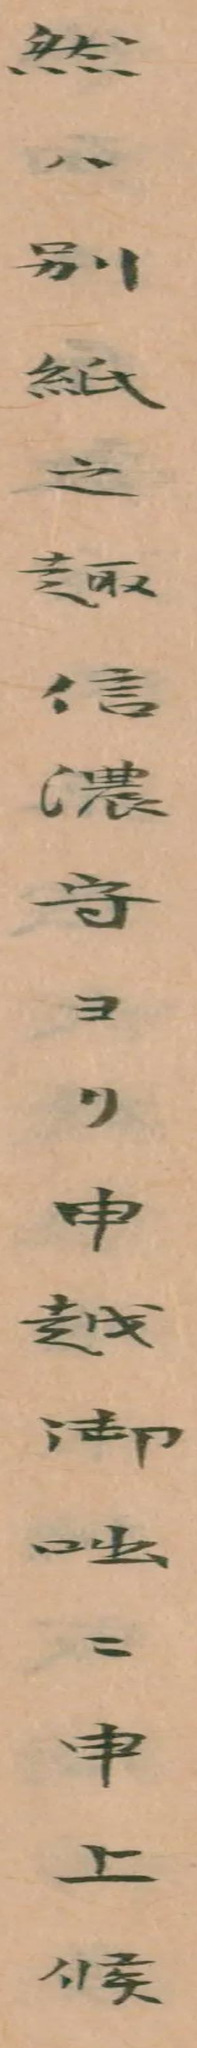然ハ別紙之趣信濃守ヨリ申越御咄二申上候
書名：地災撮要. 巻1(噴火山・地震ノ部)
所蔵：国立国会図書館 National Diet Library, JAPAN
